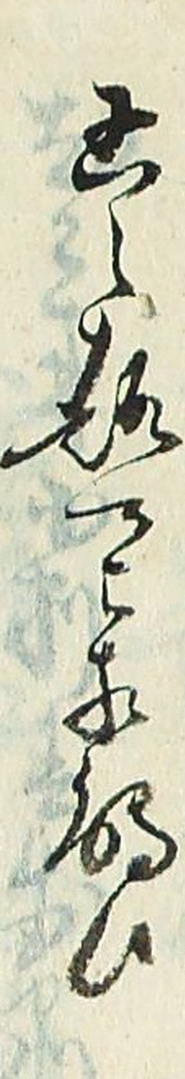右之通可相触候

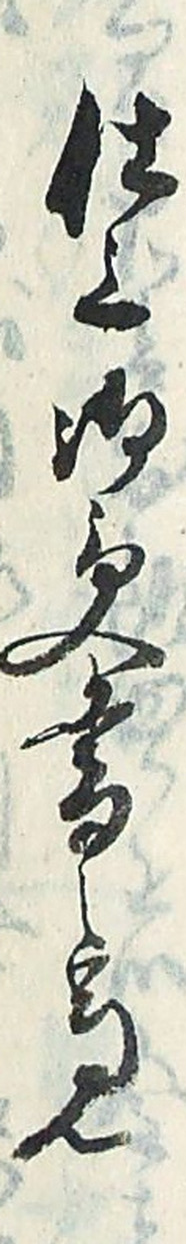仕上御受書之覚
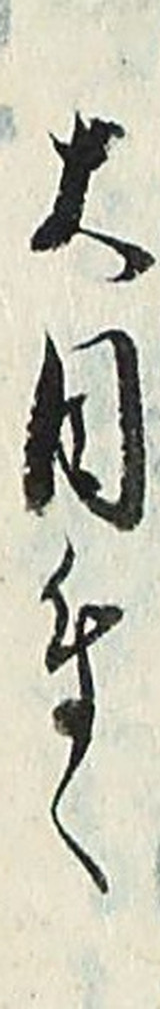大目付江
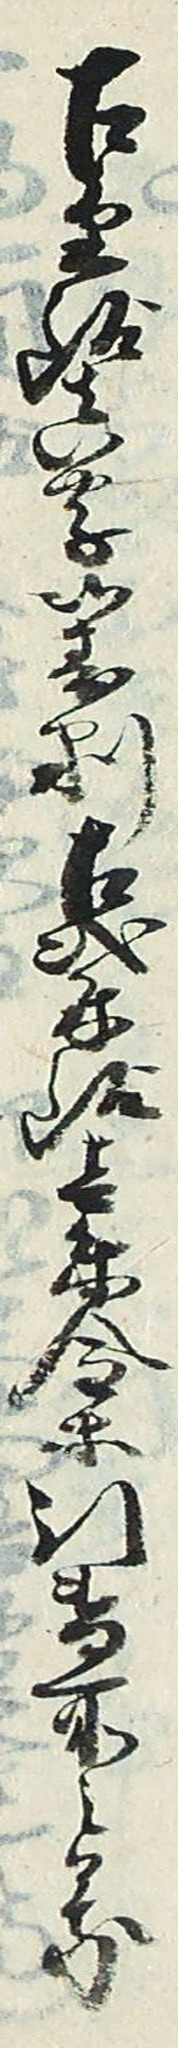古金銀真字弐歩判古弐朱銀壱朱金等引替所之義
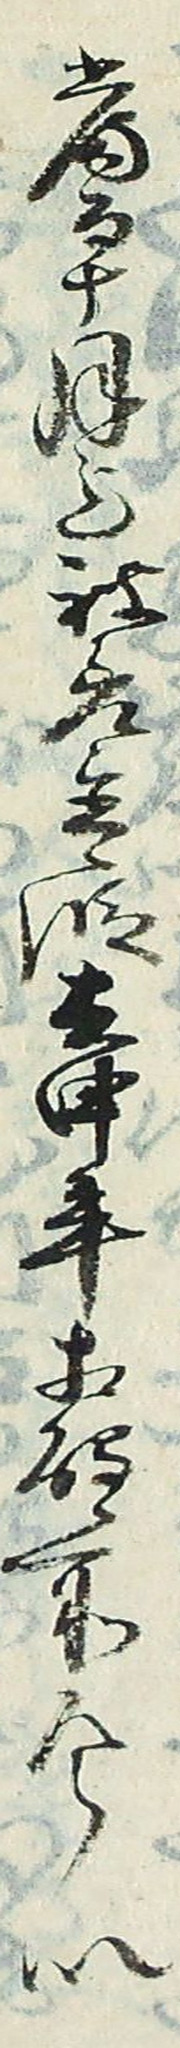当酉十月迄被差置候段去申年相触候所今以
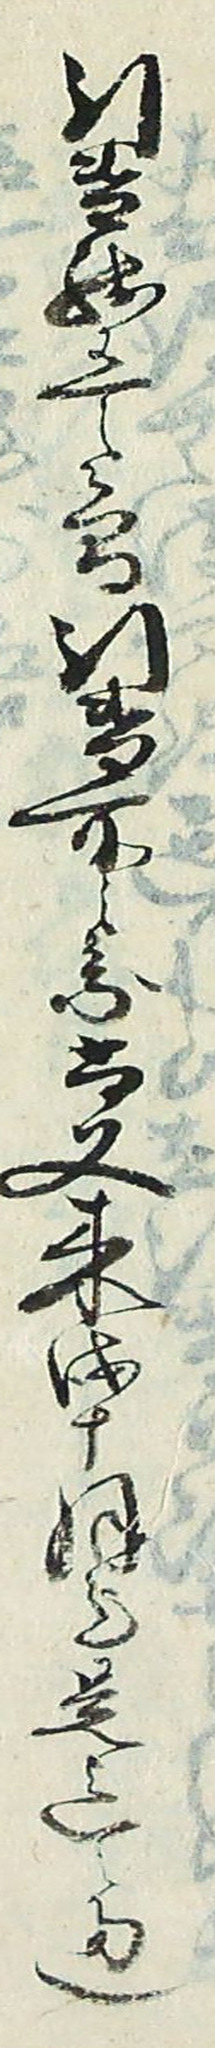引替残有之候間引替所之義尚又来戌十月迄是迄之通
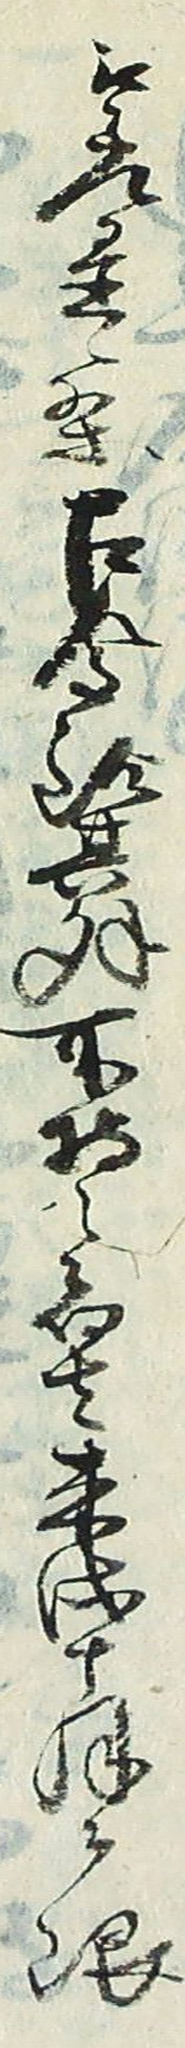被差置候条古金銀其外所持之者は来戌十月に限
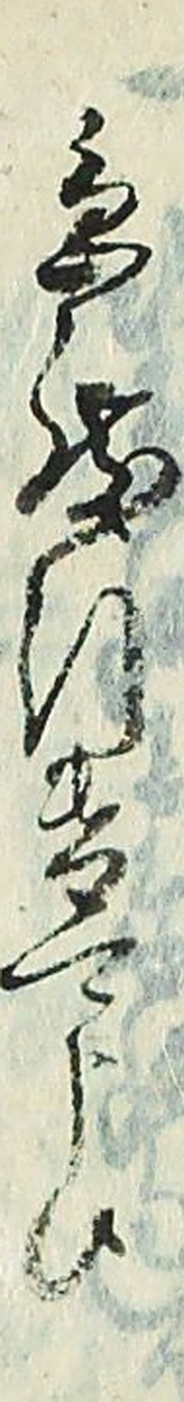急度引替可申候
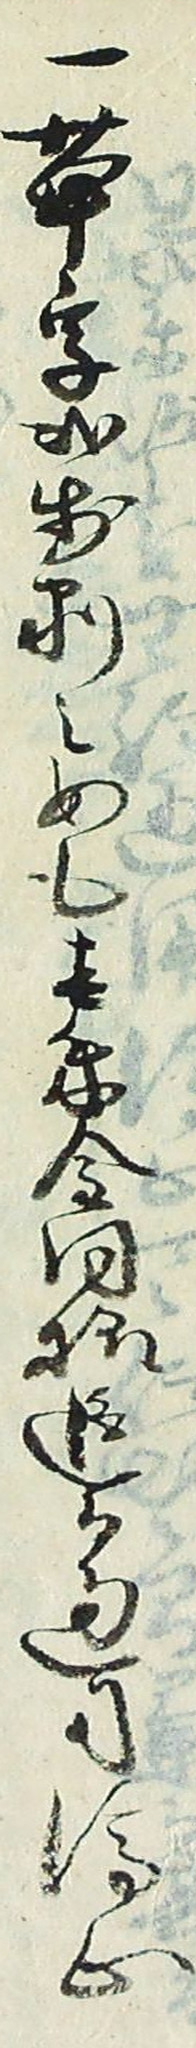一草字弐歩判之義も壱朱金同様追而通用停止
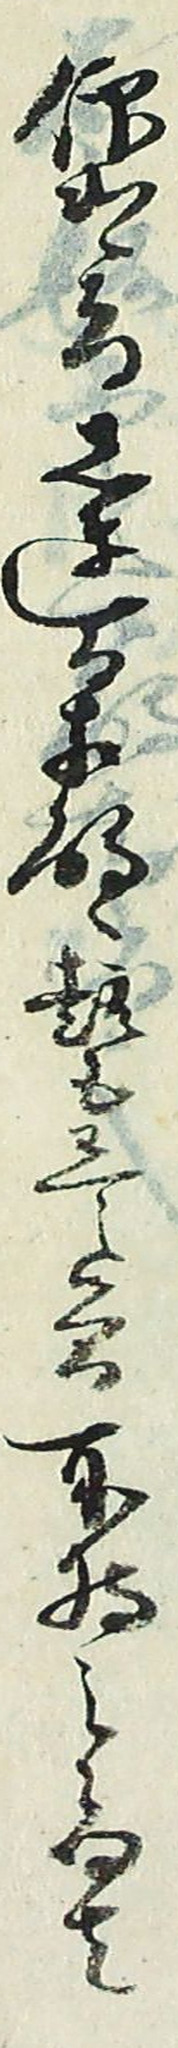仰出候旨先達而相触候趣も有之候間所持之者は
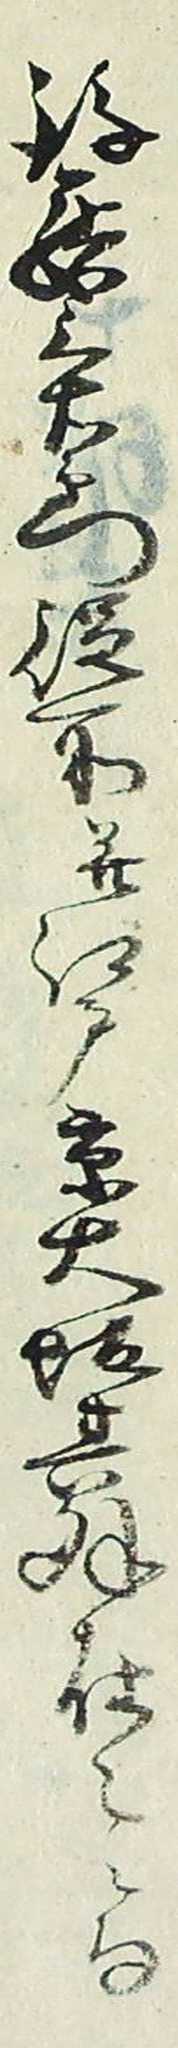後藤三右衛門役所幷江戸京大坂其外在々に而
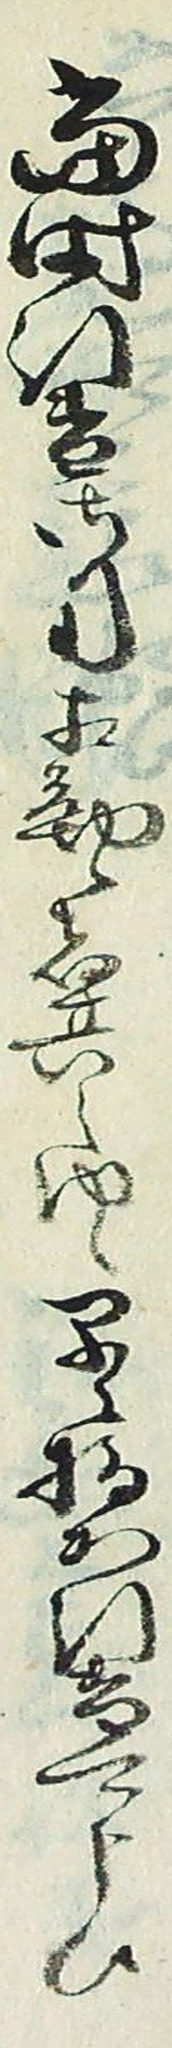当時引替御用相勤候者共之内へ早々指出引替可申候
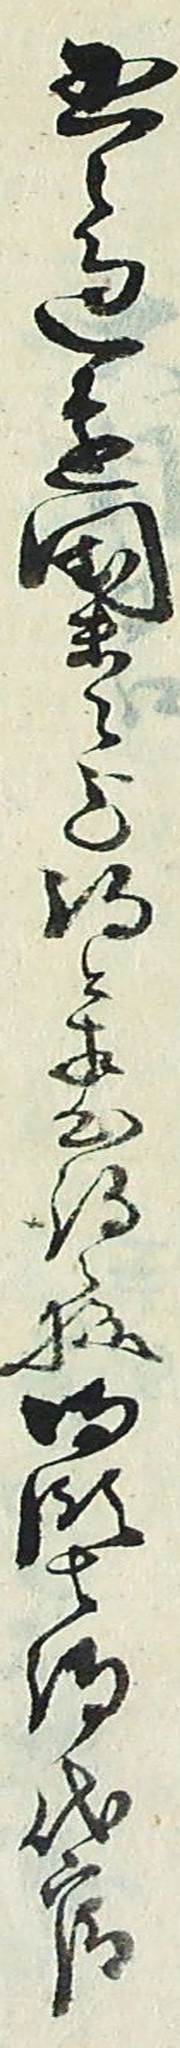右之通遠国末々迄得と相心得候様御領は御代官
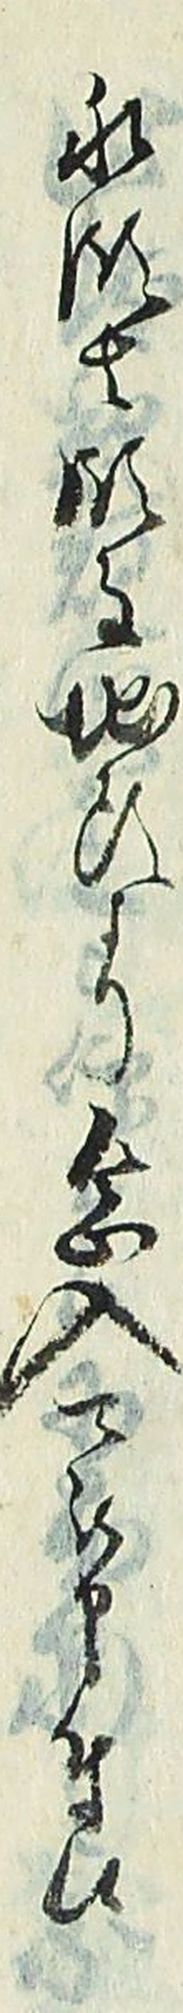私領は領主地頭より念入可被申付候
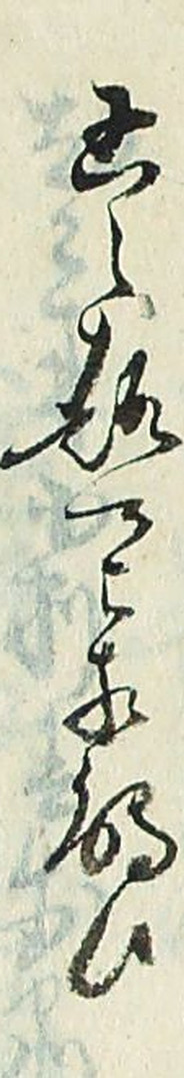右之趣可被相触候
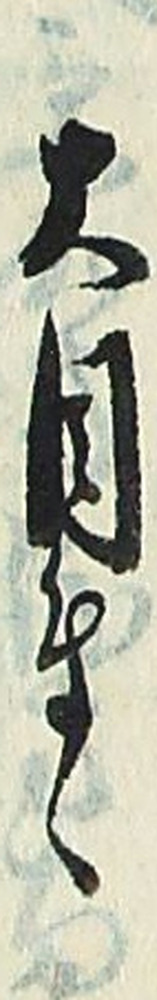大目付江
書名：諸御用御□受書控
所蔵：鳴門教育大学 Naruto University of Education
